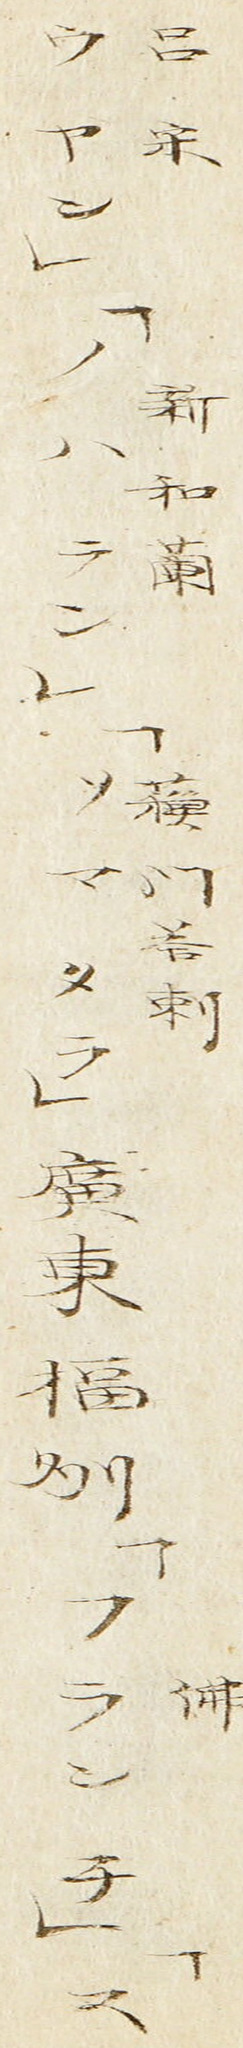ウヤン」「ノハラン」「ソマタラ」広東福州「フランチ」「ス
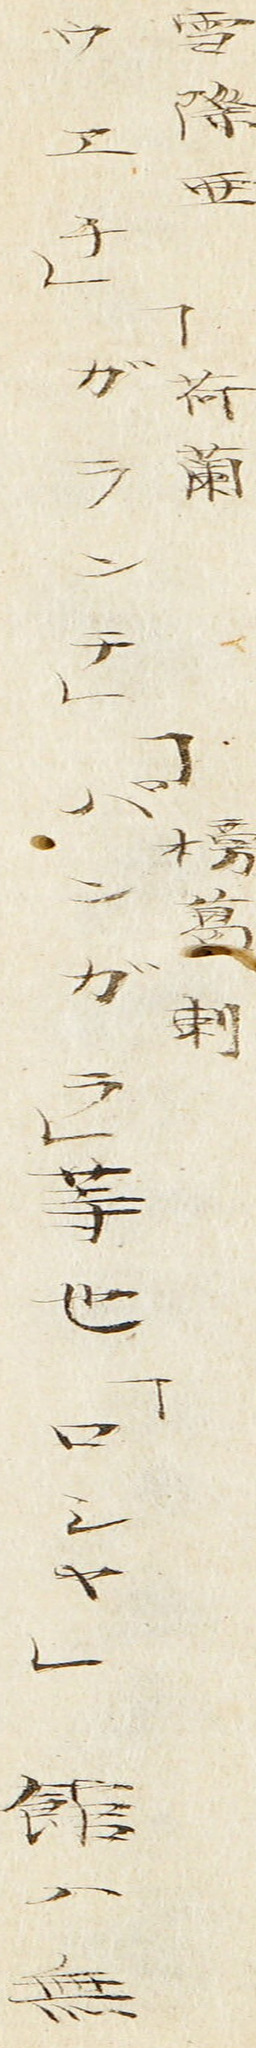ウヱチ」「ガランチ」「パンガラ」等也「ロシヤ」館ハ無
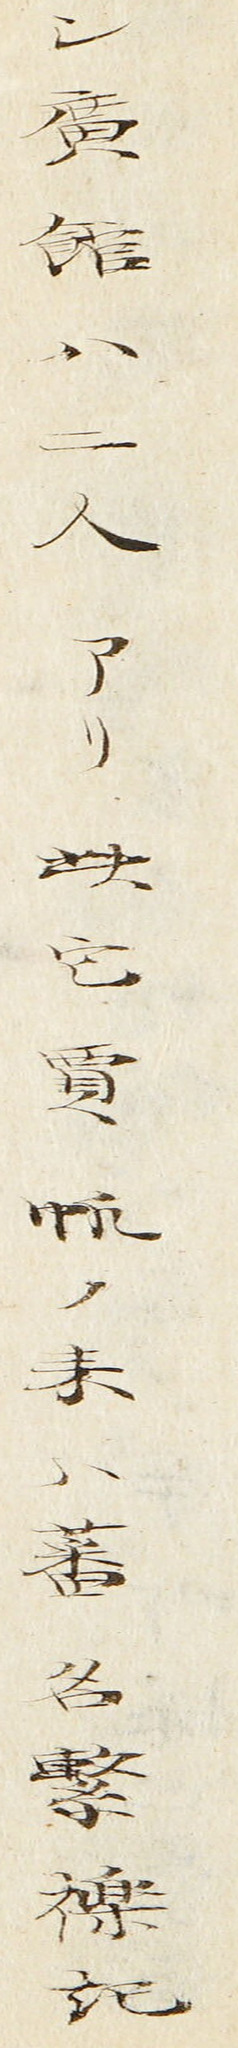シ広館ハ二人アリ此它賈帆ノ来ハ蕃名繁記
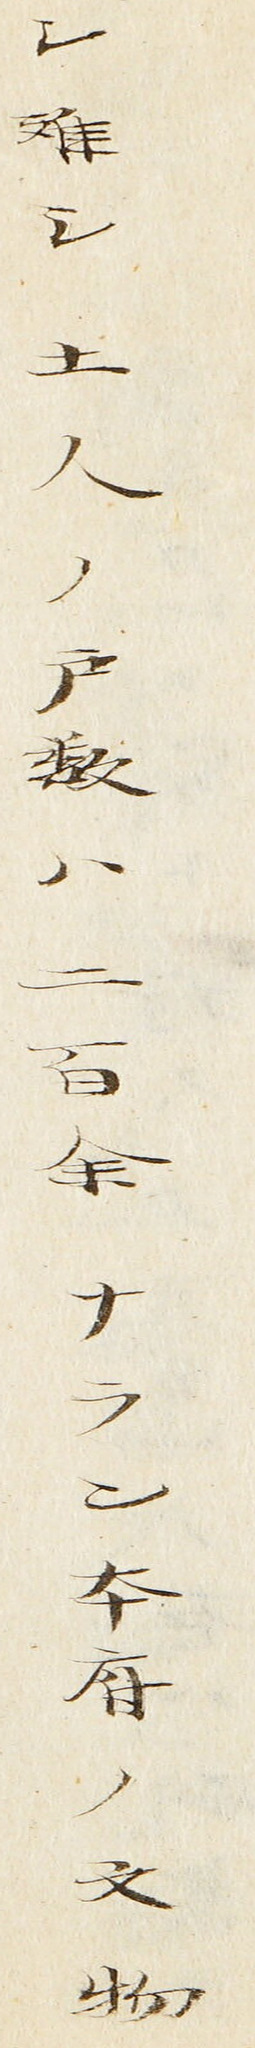シ唯シ土人ノ戸数ハ二百余ナラン本府ノ文物
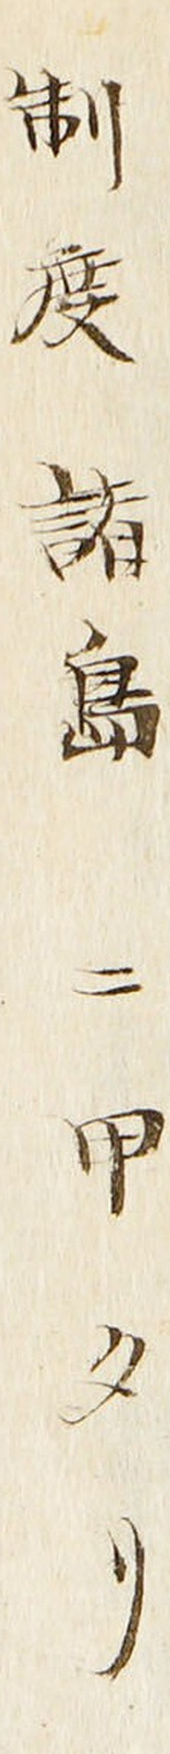制度諸島ニ甲タリ
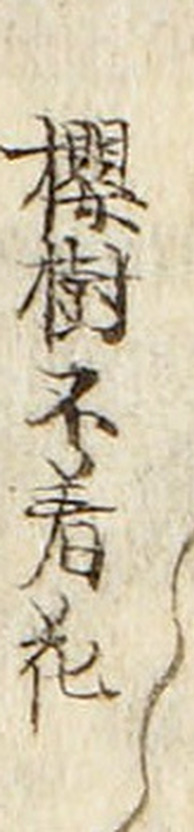桜樹不着花
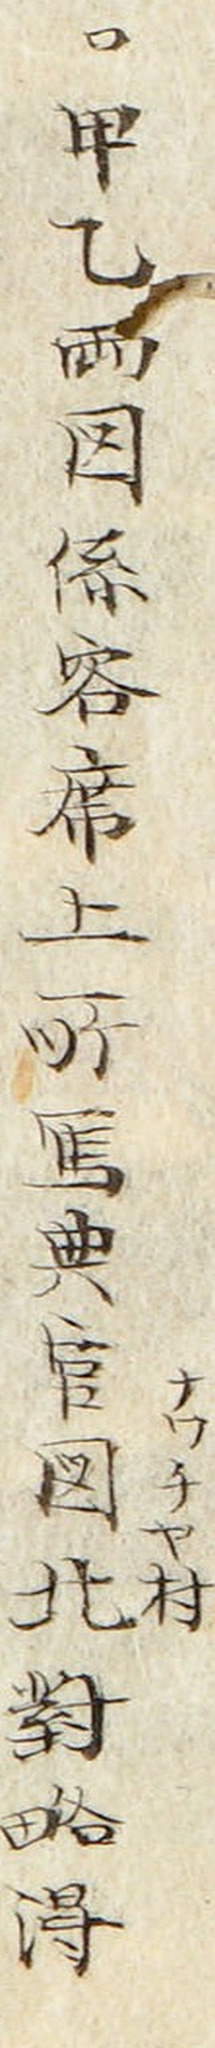◦甲乙両図係客席上所典官図北対略得

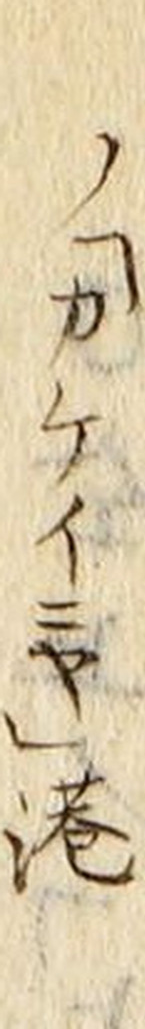ノ「カケイニヤ」港
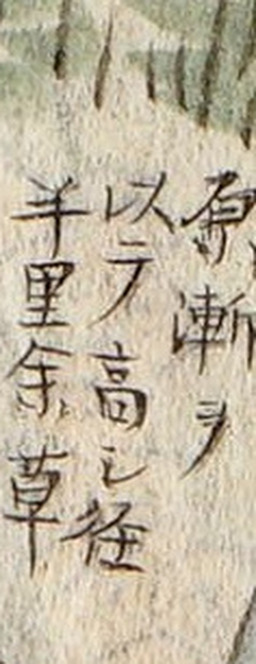半里余草

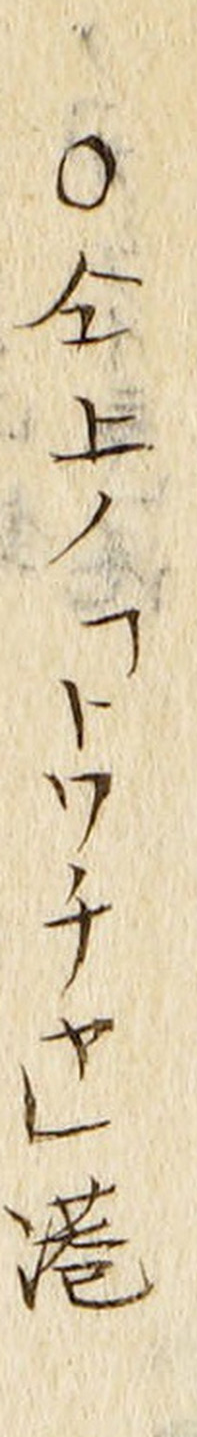◦仝上ノ「トワチヤ」港

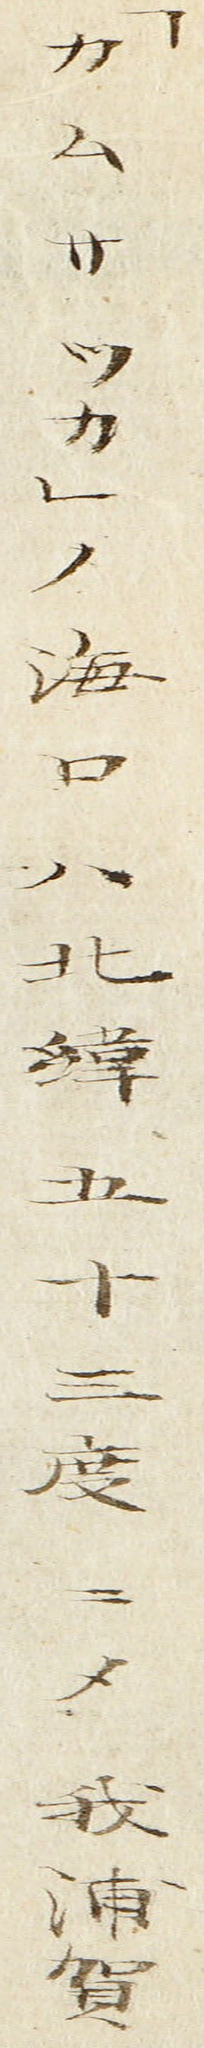「カムサツカ」ノ海口ハ北緯五十三ニシテ我浦賀
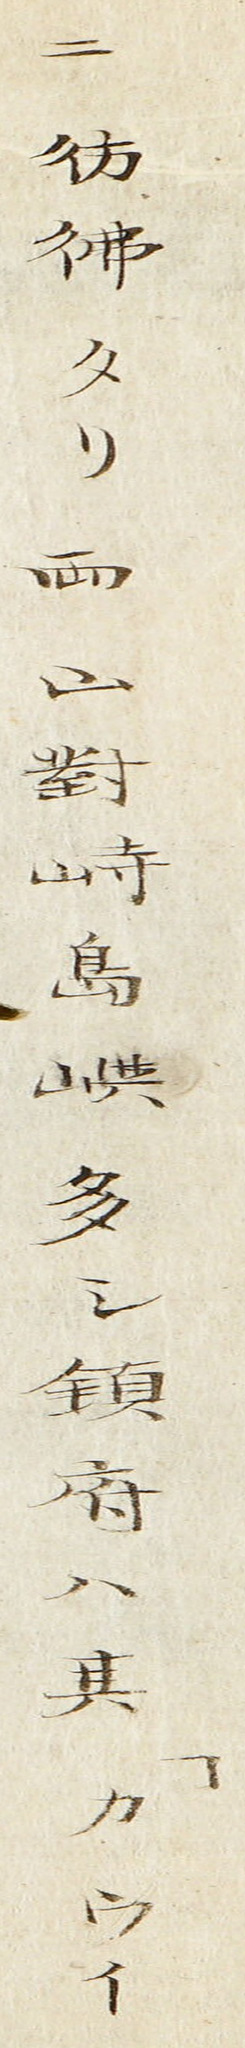ニ彷彿タリ両山対峙島嶼多シ鎮府ハ其「カウイ
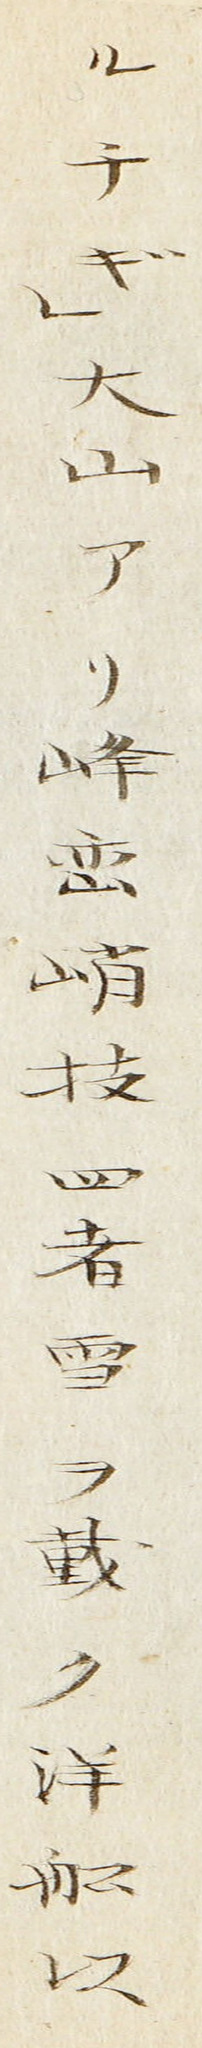ルチギ」大山アリ峰峦峭技四者雪ヲ戴く洋船以
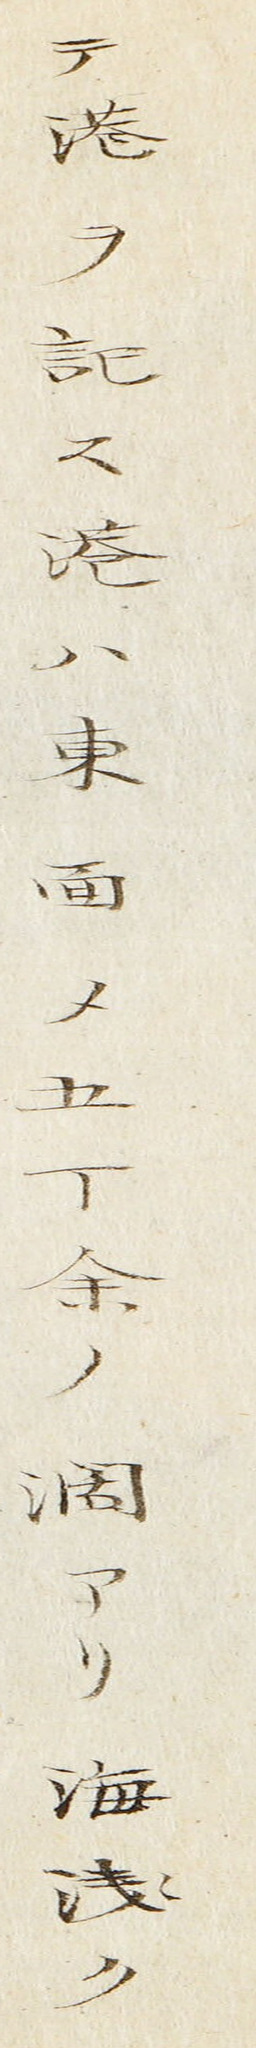テ港ヲ記ス港ハ東面シテ五丁余ノ濶アリ海浅ク
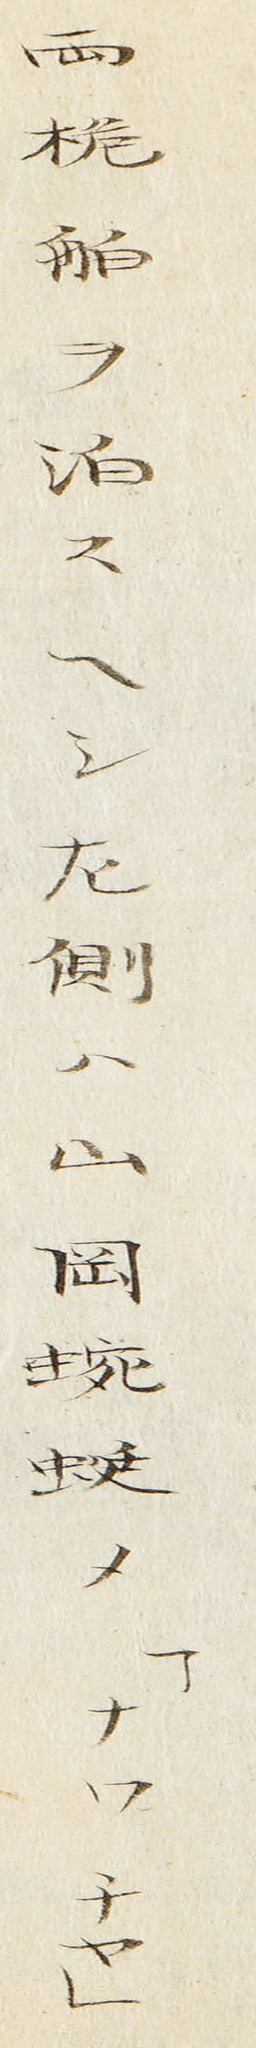両桅舶ヲ泊スヘシ左側ハ山岡蜿蜓シテ「ナワチヤ」
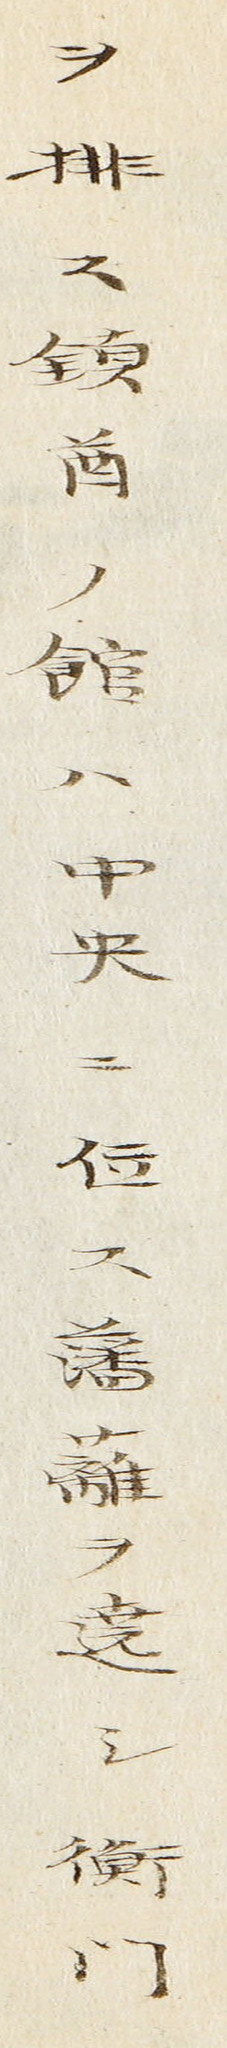ヲ排ス鎮酋ノ館ハ中央ニ位ス藩蘺ヲ遶シ衡門
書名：流蕃通書
